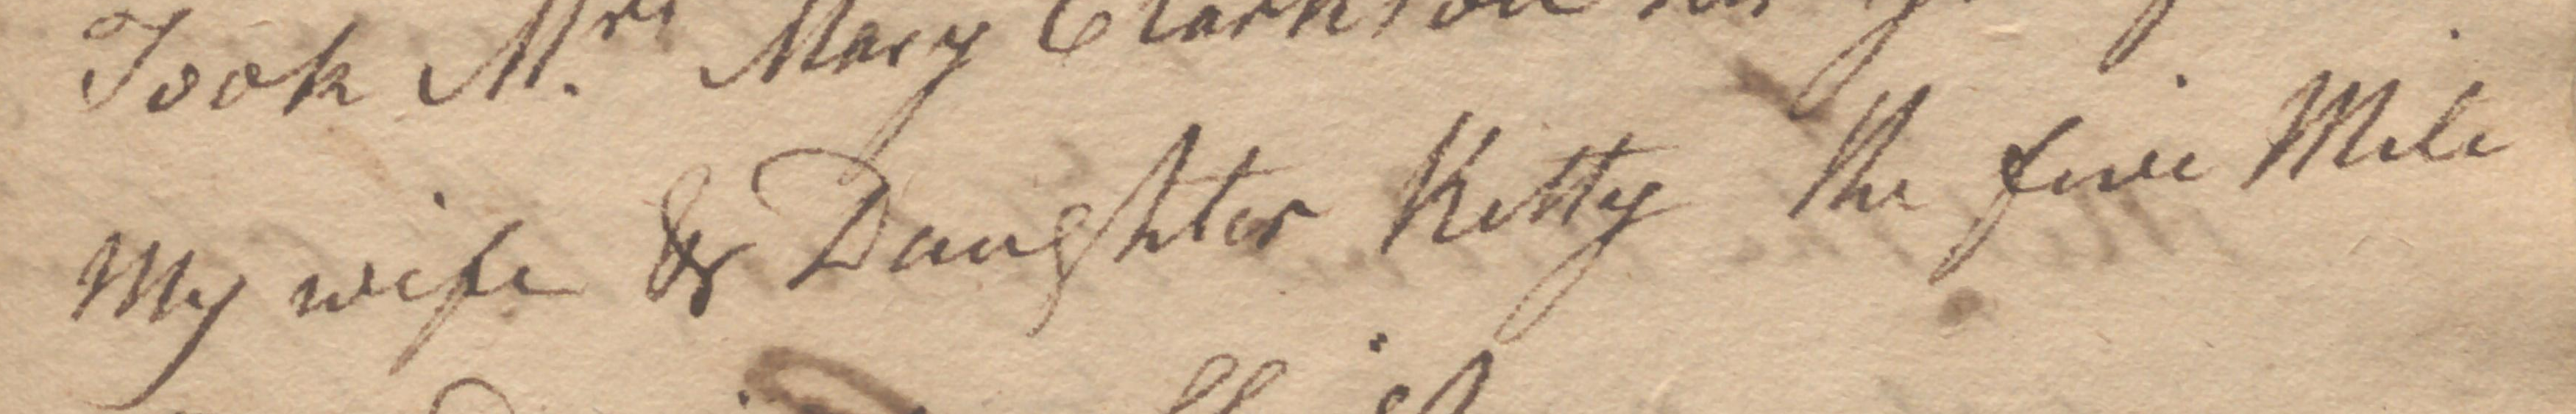My wife & Daughter Kitty the five Mile
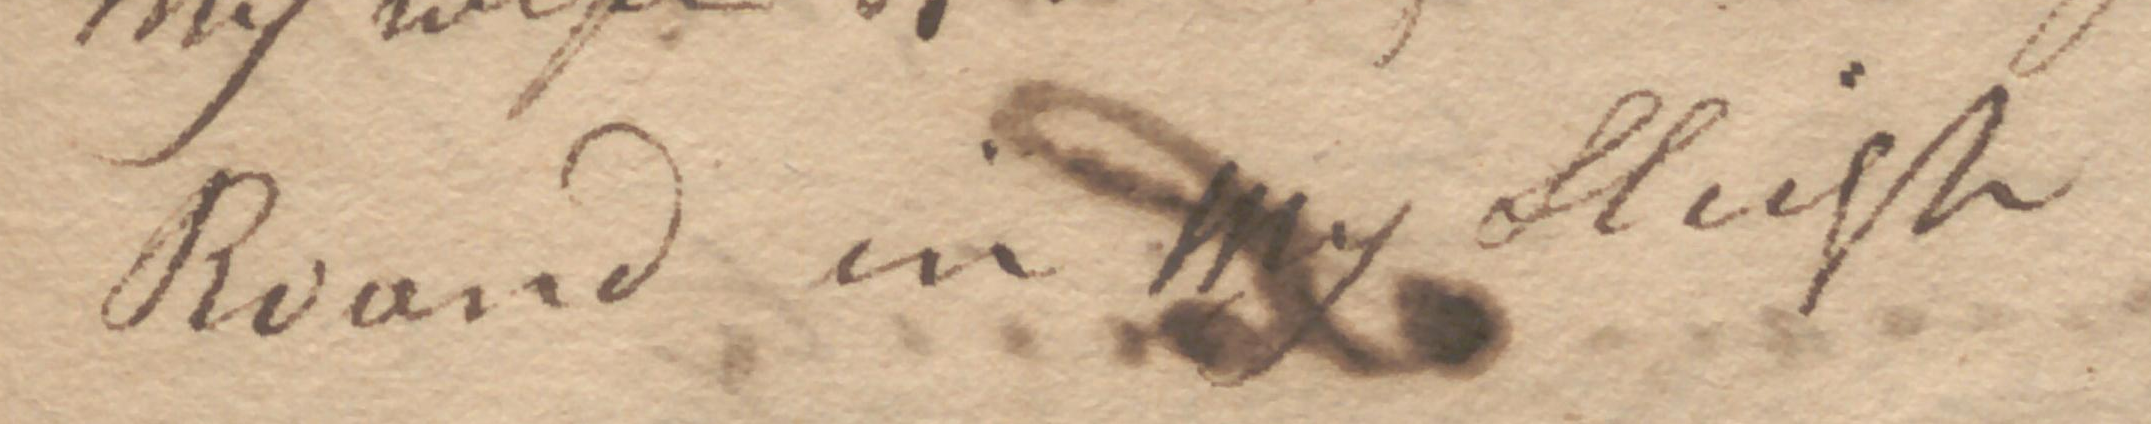Round in My Sleigh
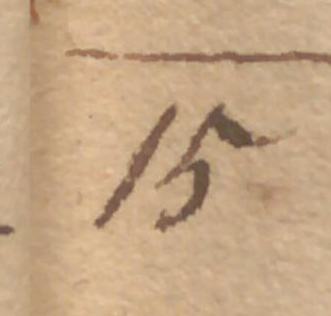15
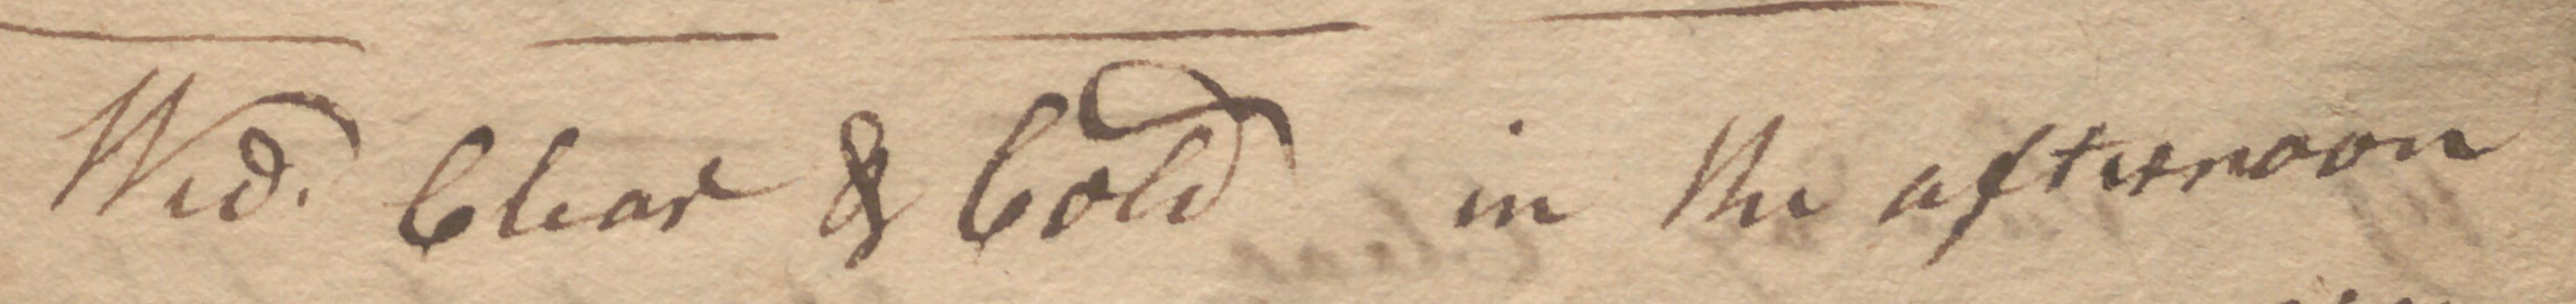Wed. Clear & Cold in the afternoon
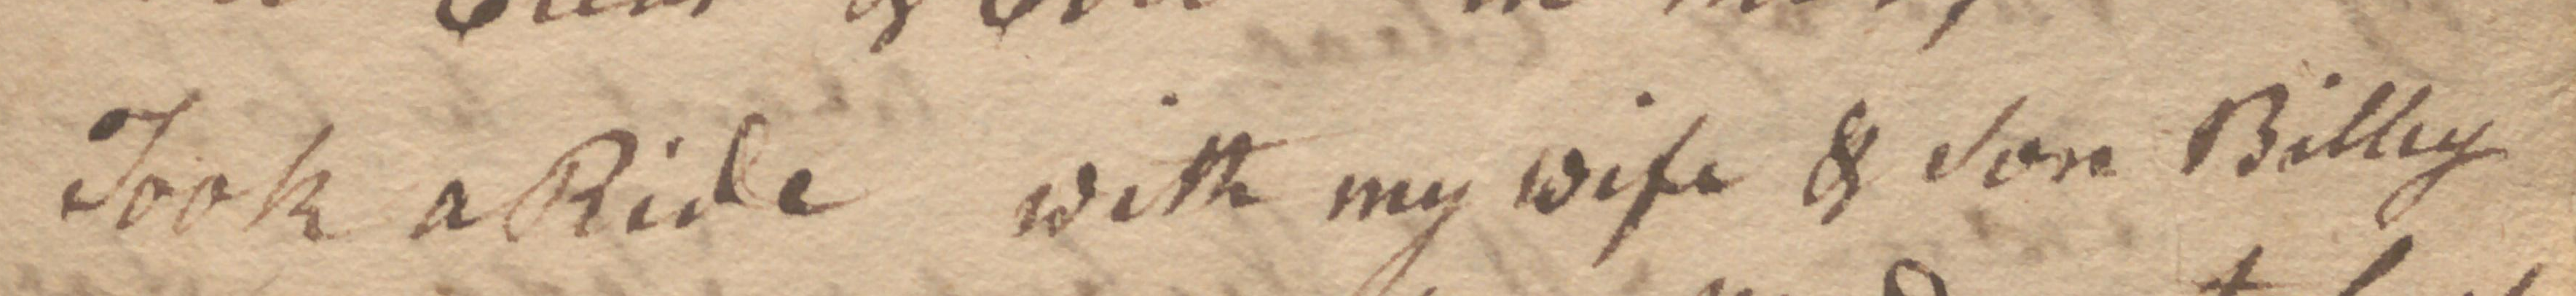Took a Ride with my wife & son Billey
